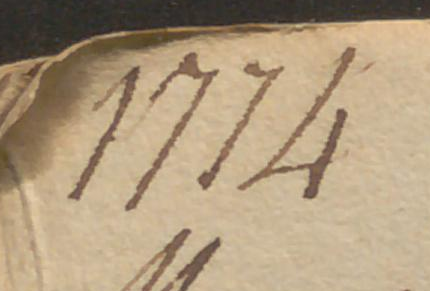1774
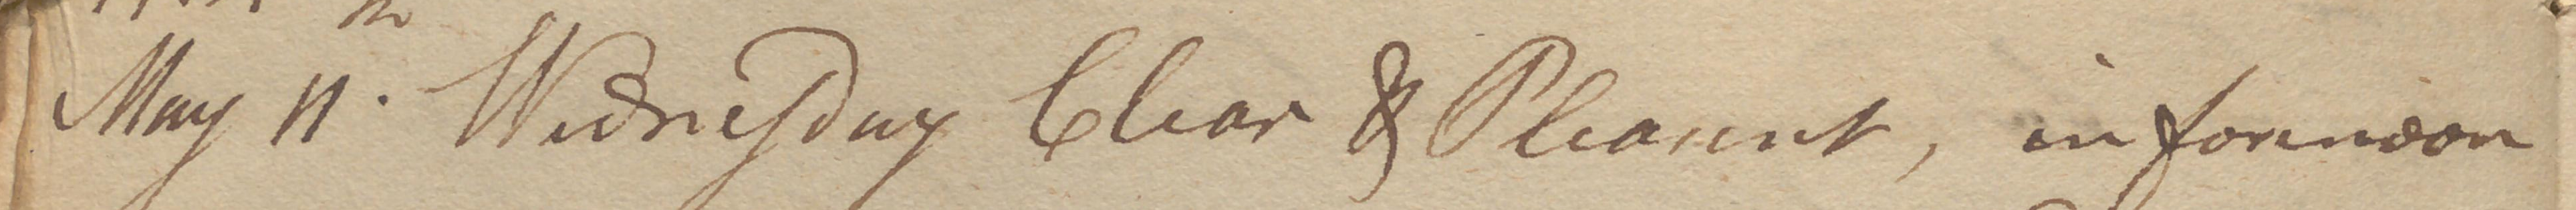May 11^th. Wednesday Clear & Pleasent, in fornoon
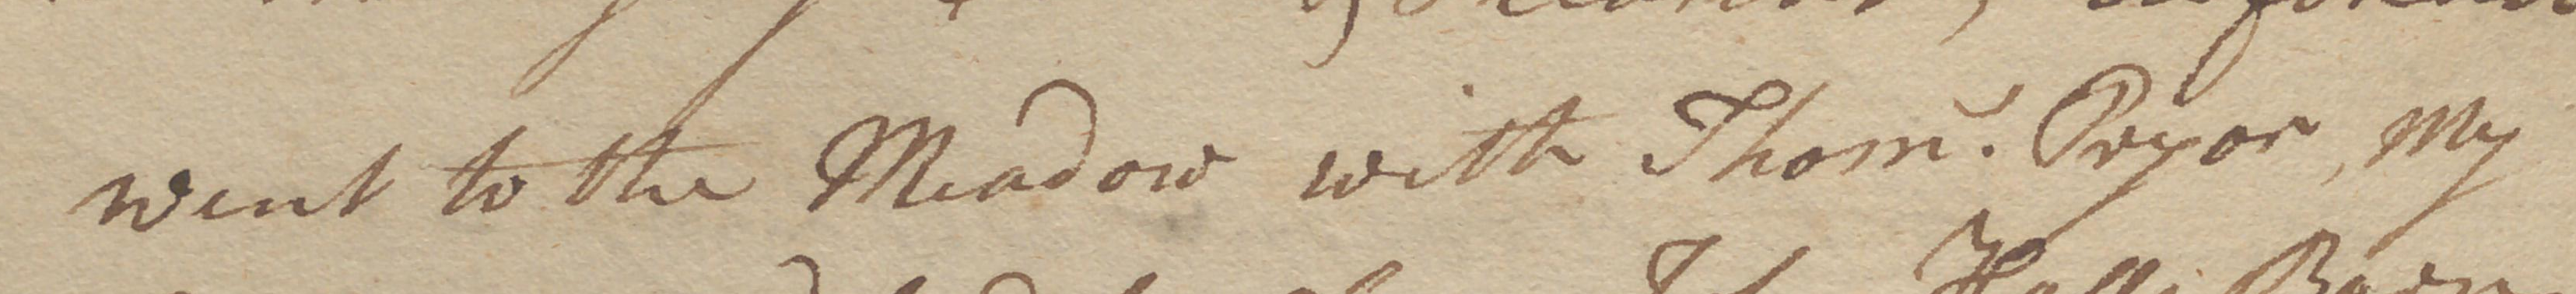went to the Meadow with Thom^s. Pryor, My
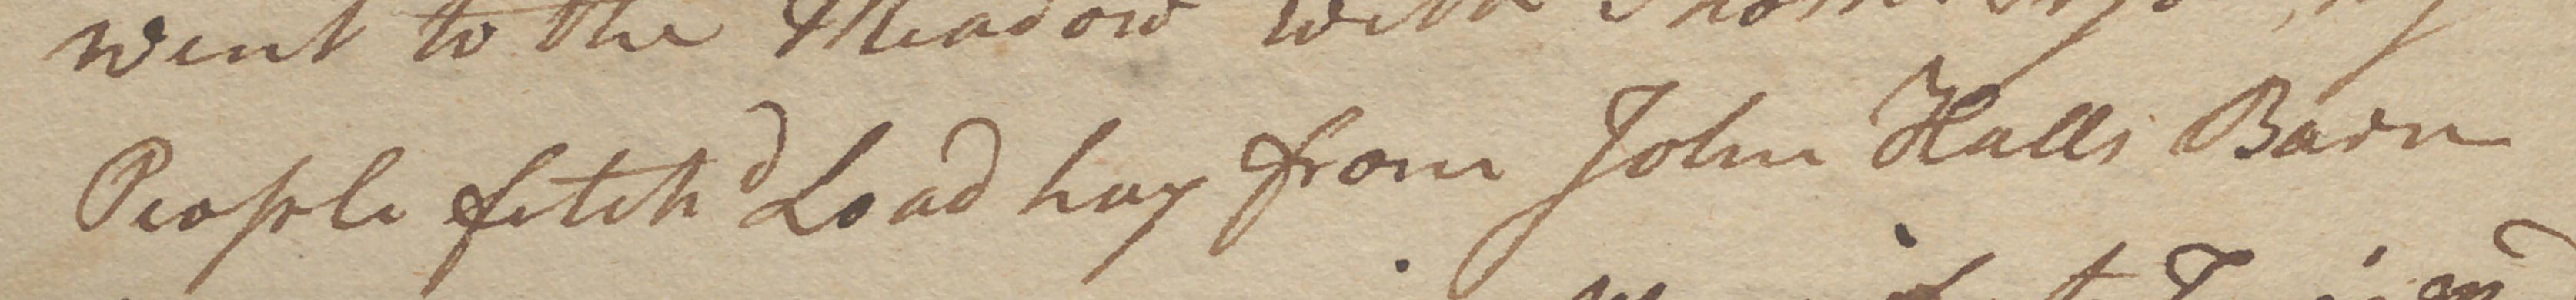People fetch^d Load hay from John Halls Barn
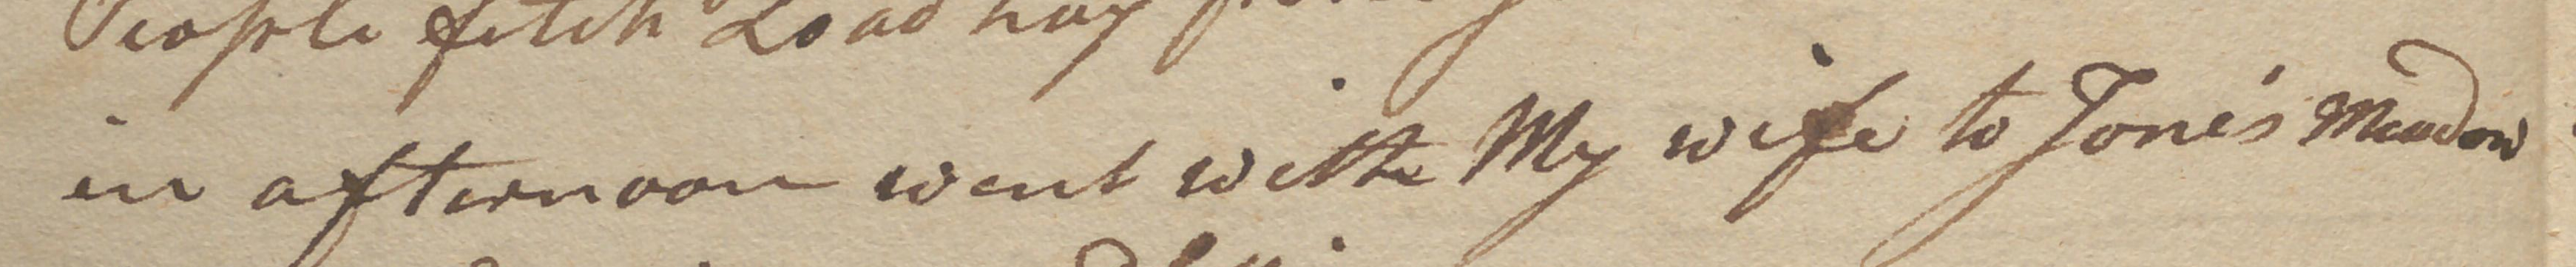in afternoon went with My wife to Jones Meadow
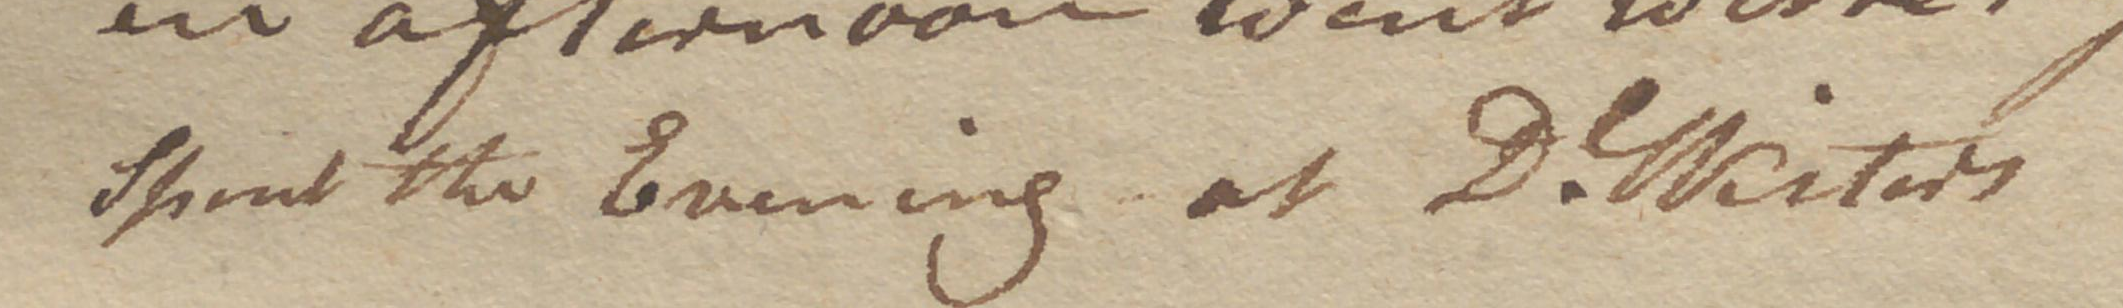spent the Evening at D^r. Wisters
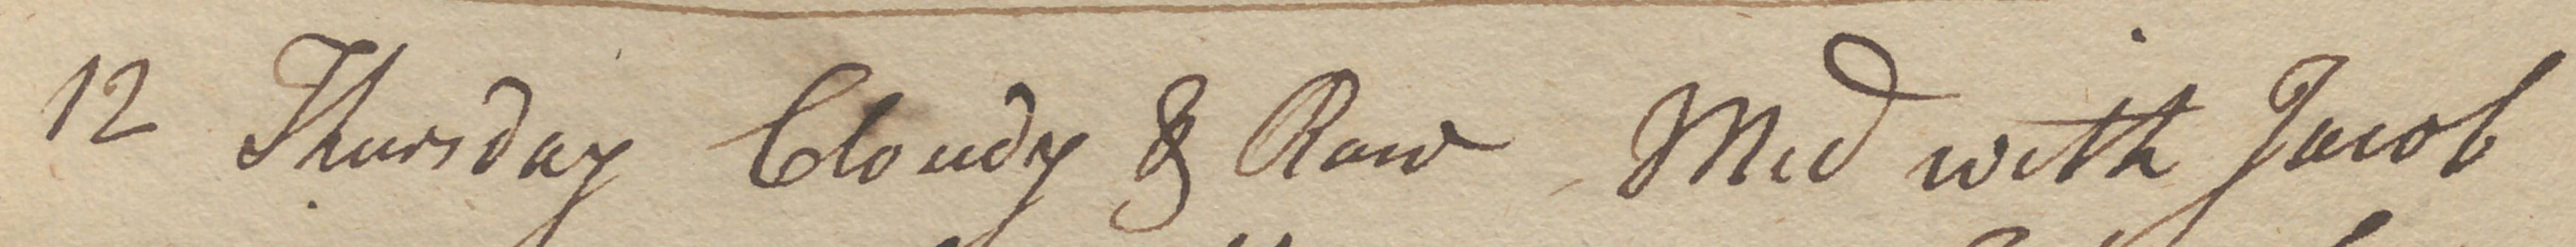12 Thursday Cloudy & Raw Med with Jacob
